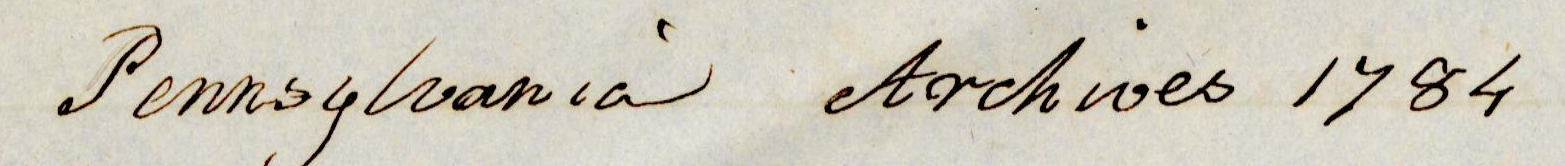Pennsylvania Archives 1784
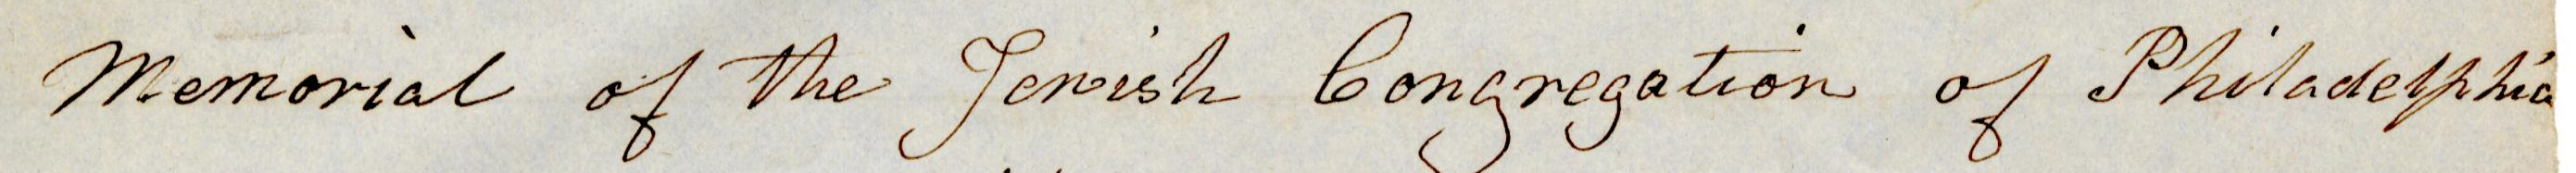Memorial of the Jewish Congregation of Philadelphia
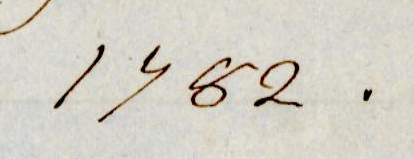1782.
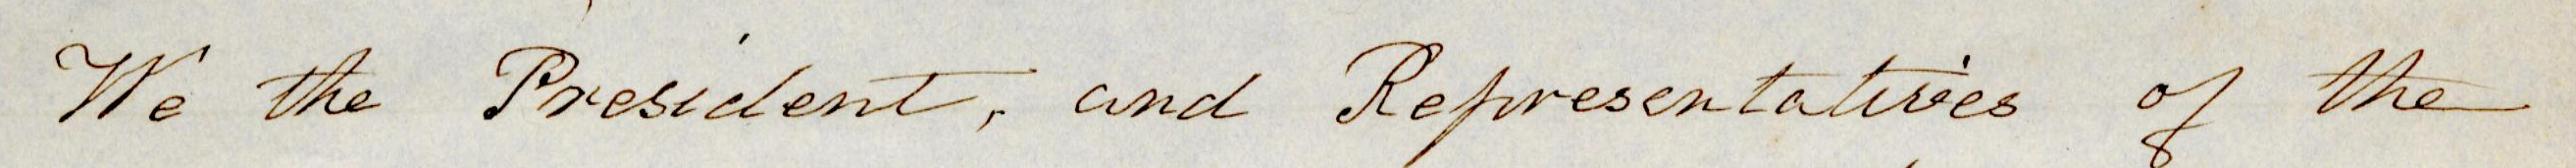We the President, and Representatives of the
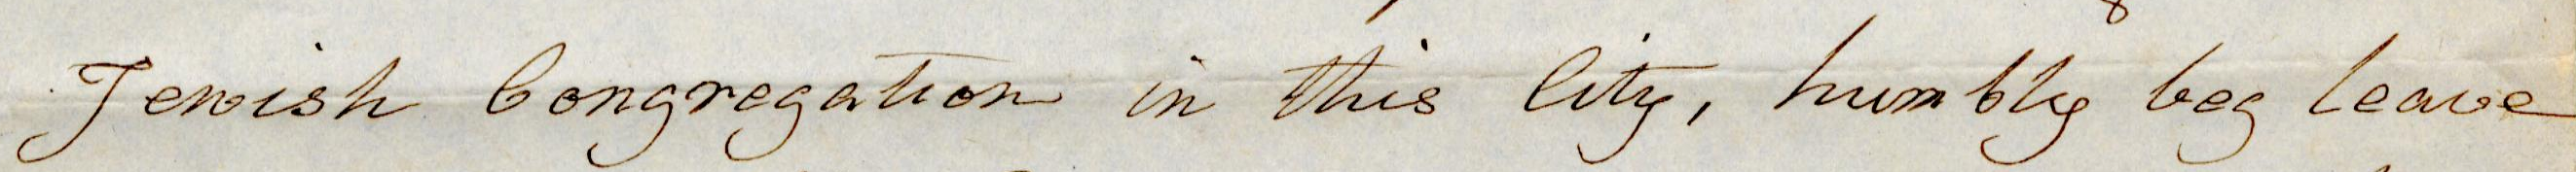Jewish Congregation in this city, humbly beg leave
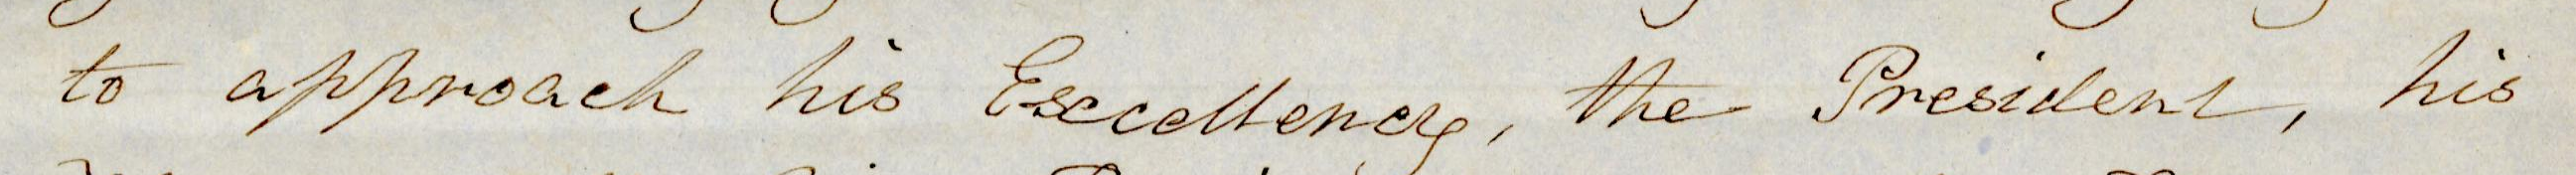to approach his Escellency, the President, his
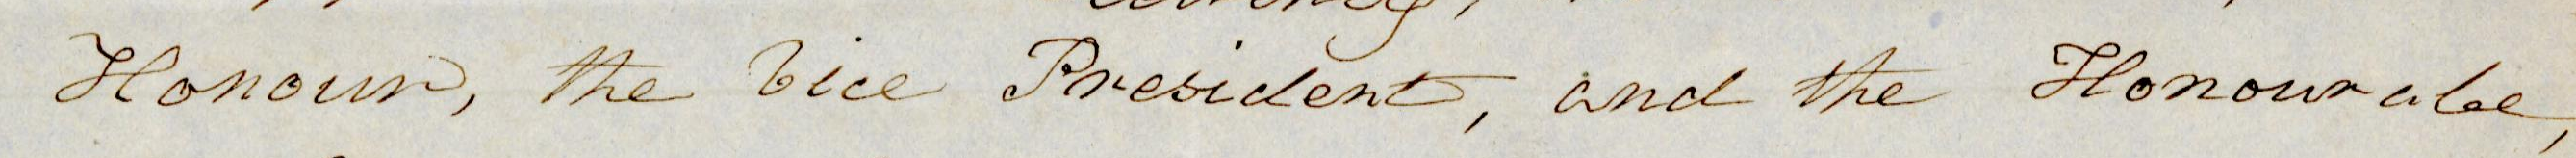Honour, the Vice Presidents, and the Honourable,
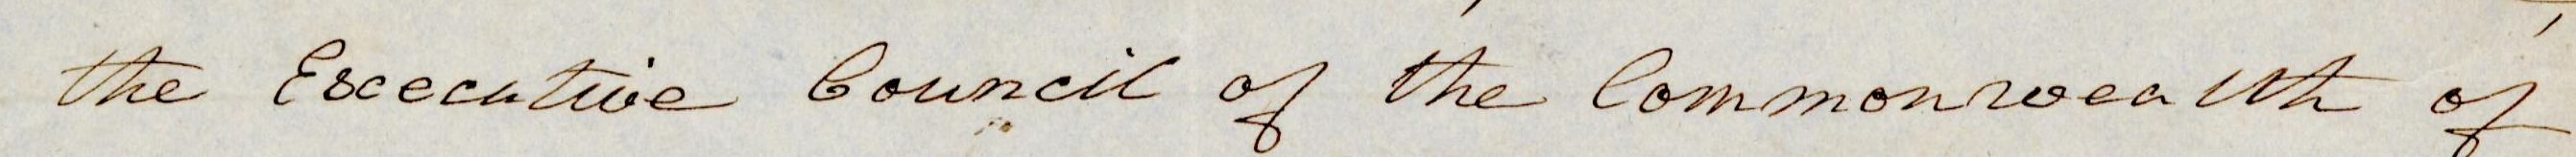the Escecutive Council of the Commonwealth of
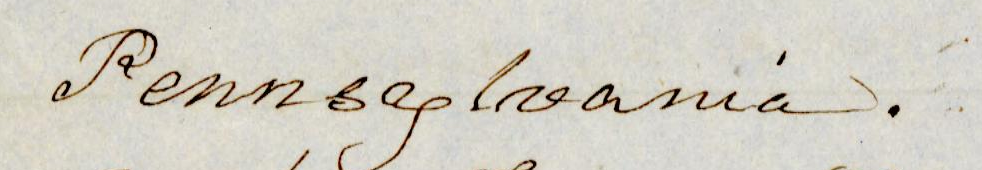Pennsylvania.
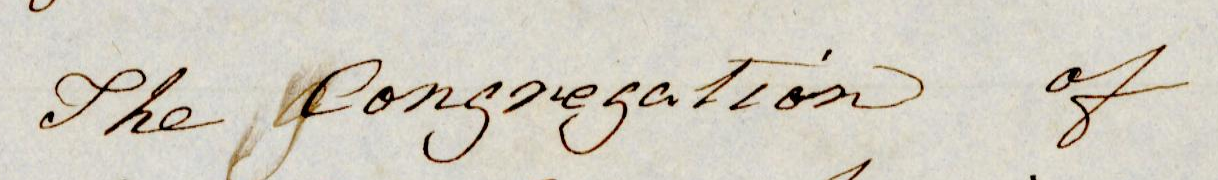The Congregation of
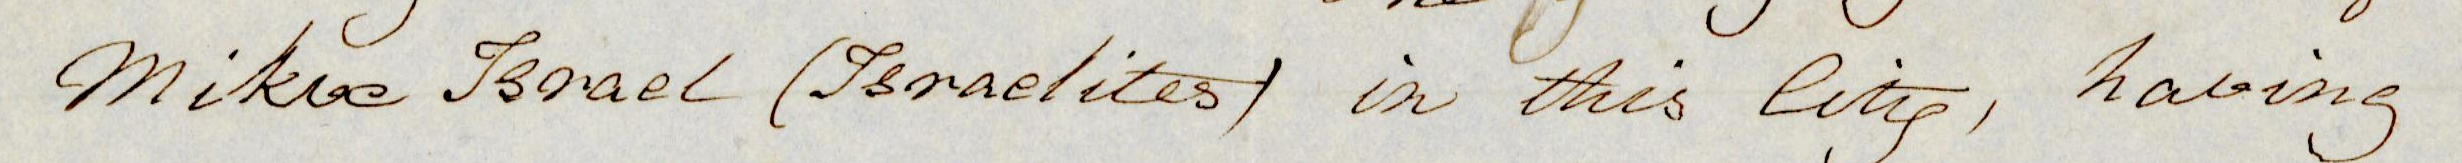Mikve Isreal (Israelites) in this City, having
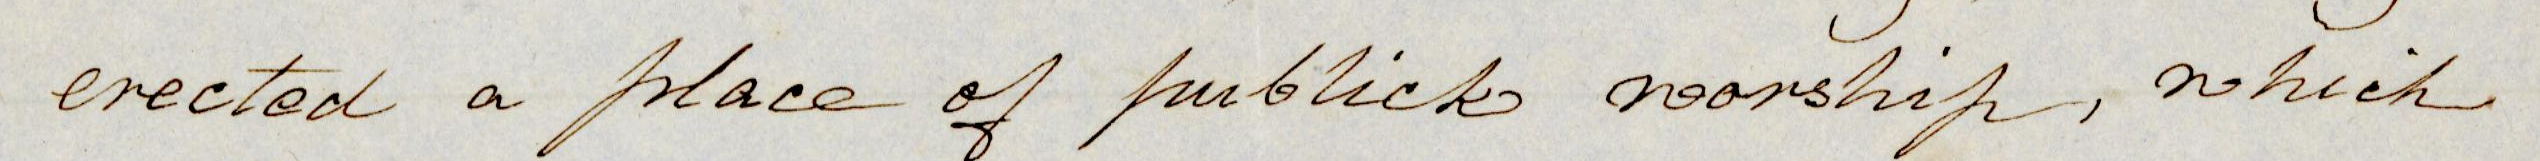erected a place of publick worship, which
